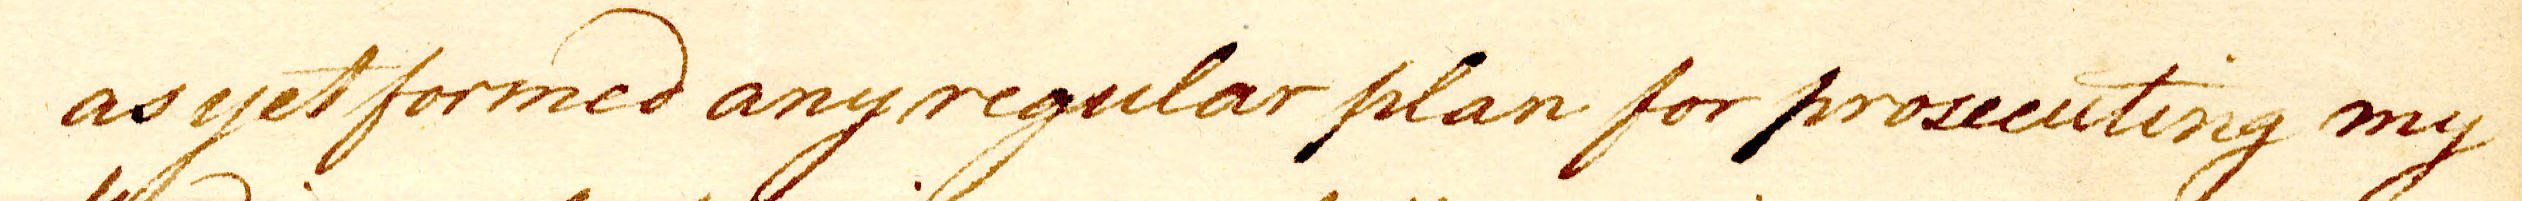as yet formed any regular plan for prosecuting my
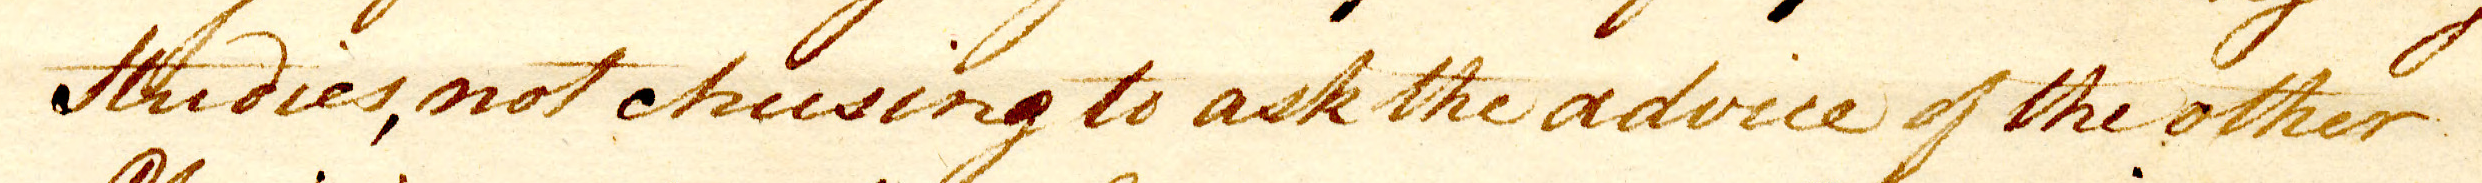Studies, not chusing to ask the advice of the other
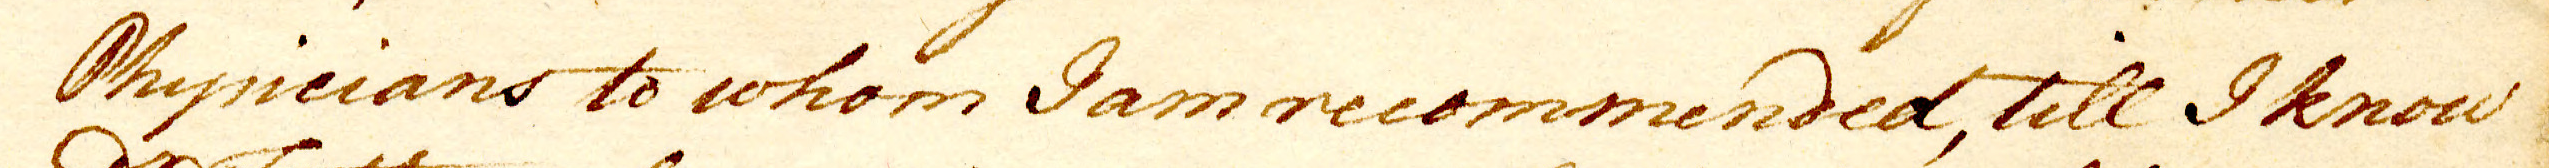Physicians to whom I am recommended, till I know
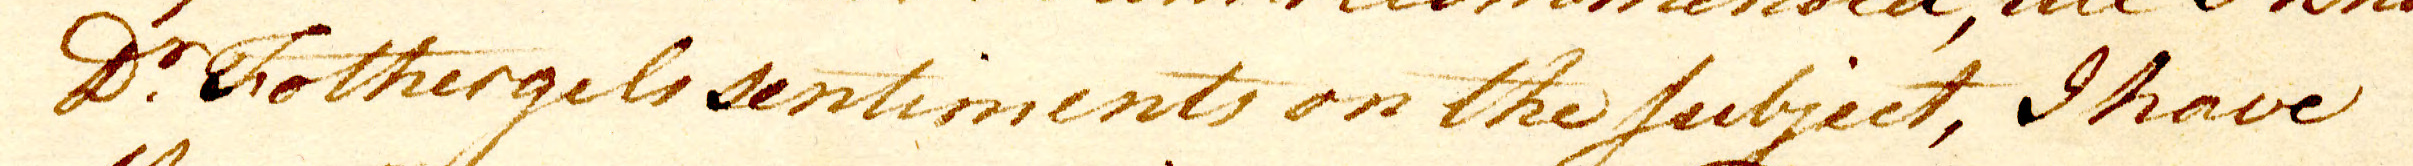D^r. Fothergels sentiments on the subject, I have
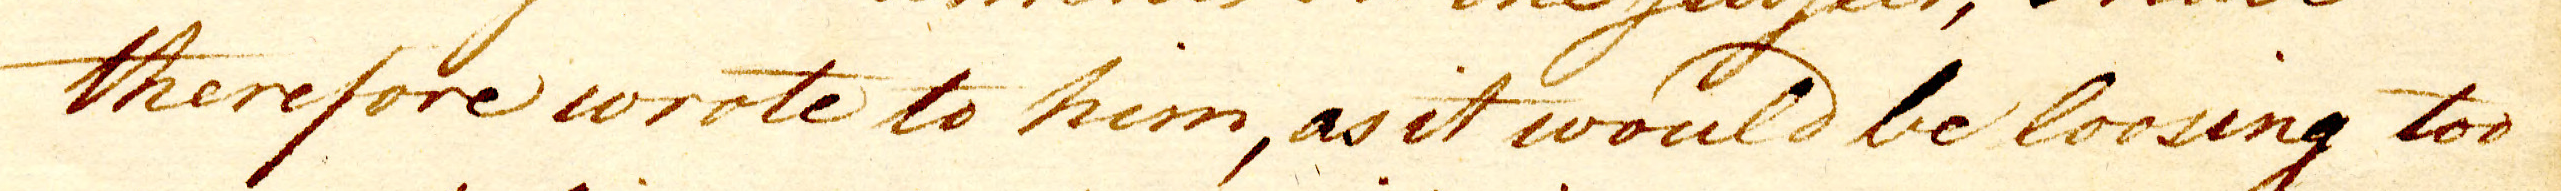therefore wrote to him, as it would be loosing too
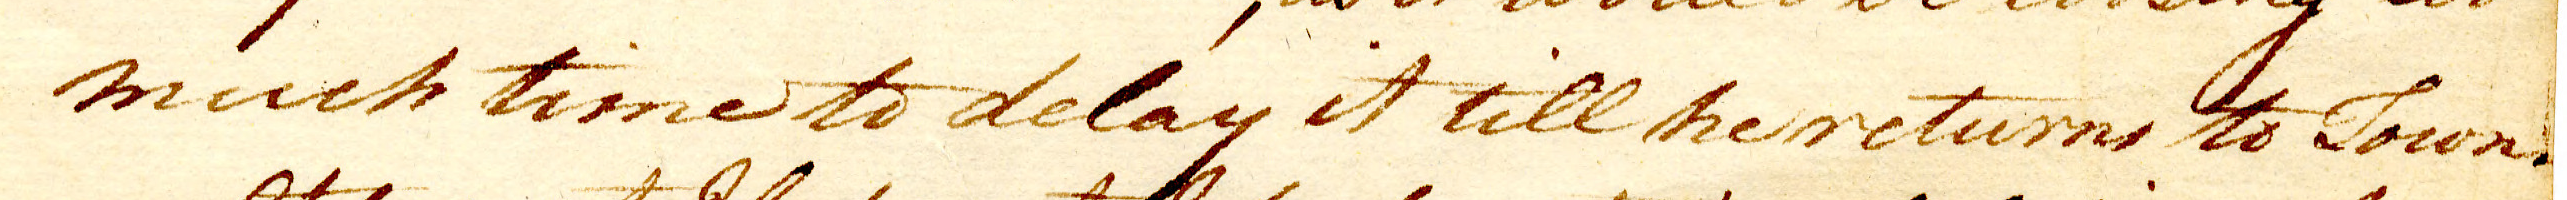much time to delay it till he returns to Town.
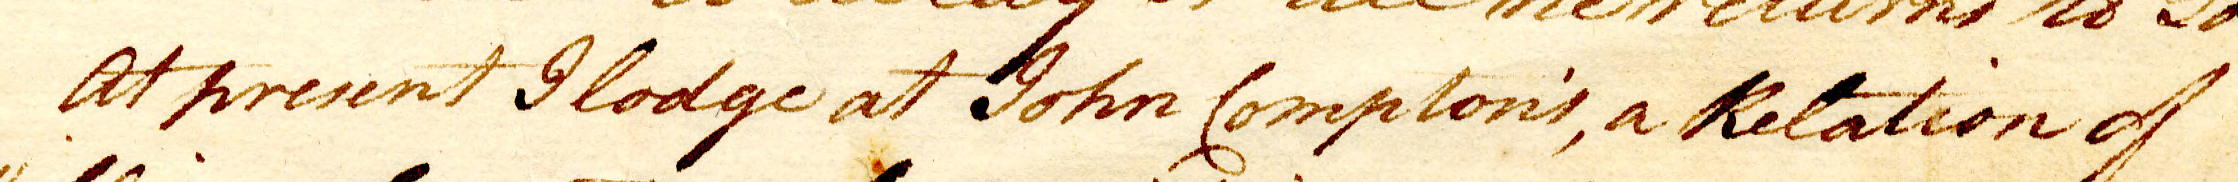At present I lodge at John Compton's, a Relation of
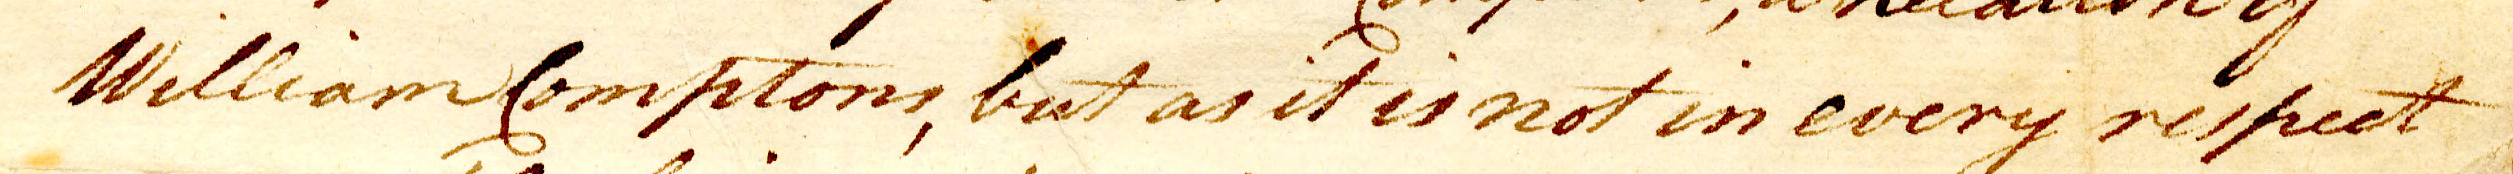William Comptons, but as it is not in every respect
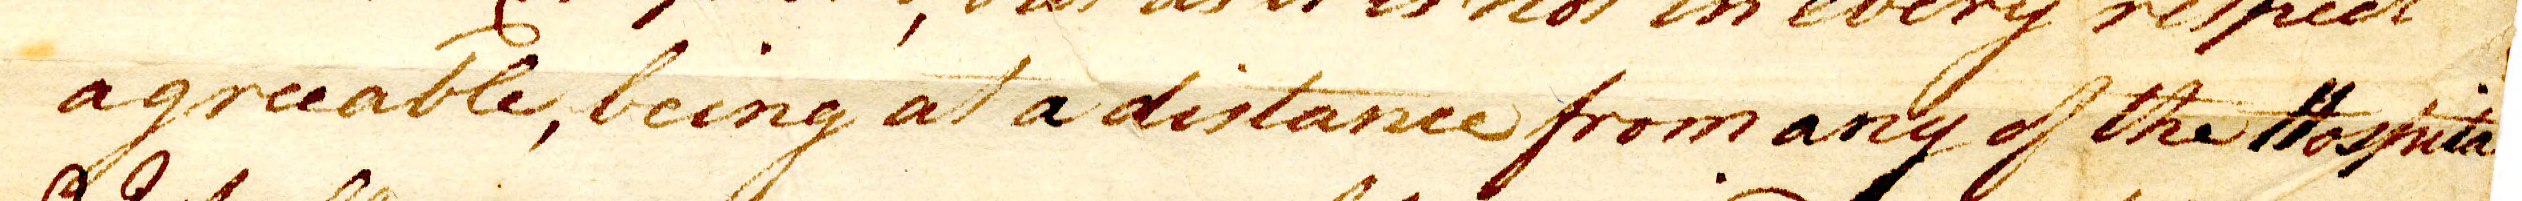agreeable, being at a distance from any of the Hospita
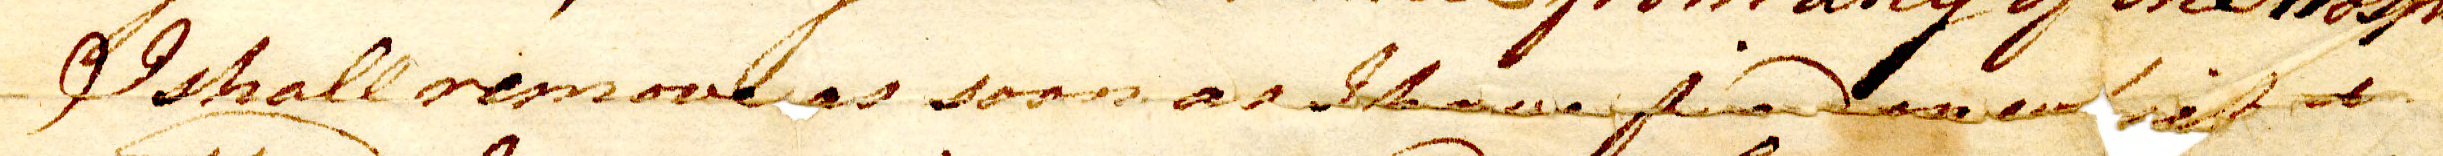I shall remove as soon as I have found [_____] [__] [_]
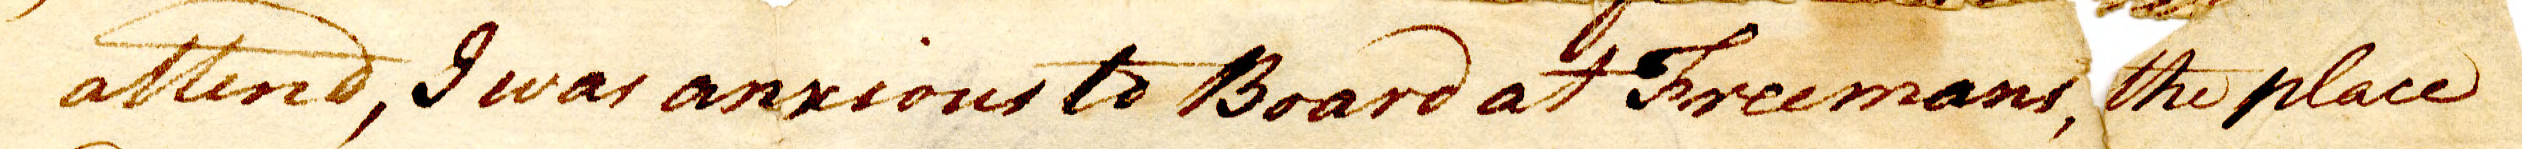attend, I was anxious to Board at Freemans, the place
